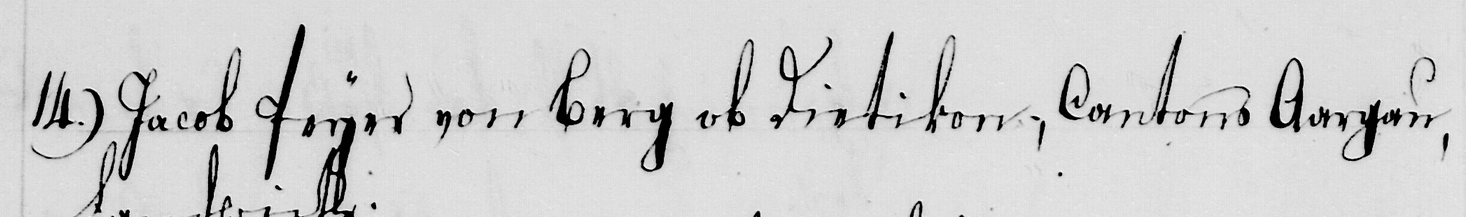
14.) Jacob Peyer von Berg ob Dietikon, Cantons Aargau,
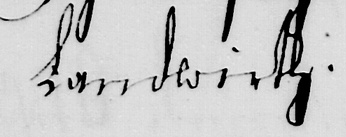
Landwirth.
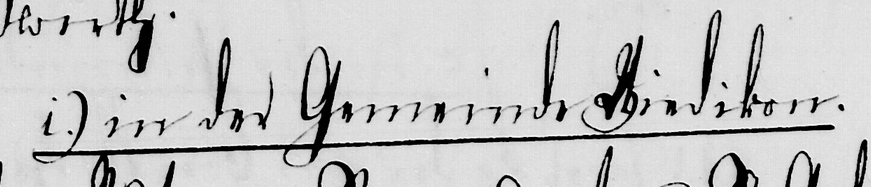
i.) in der Gemeinde Wiedikon.
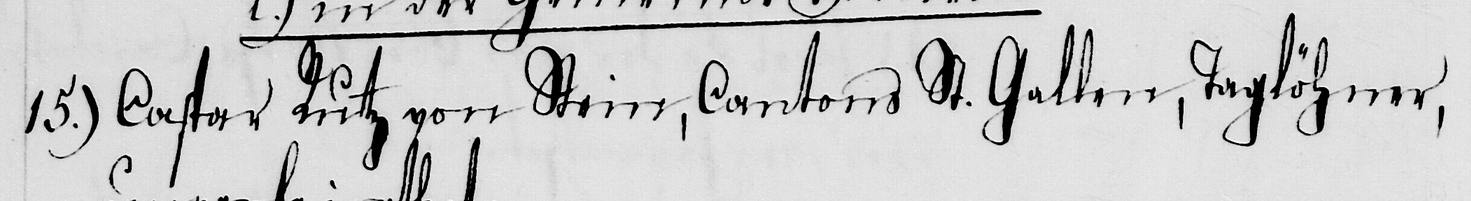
15.) Caspar Rutz von Stein, Cantons St. Gallen, Taglöhner,
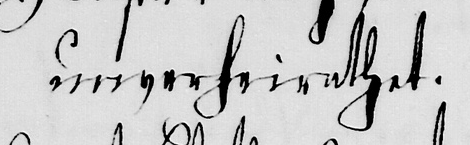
unverheirathet.
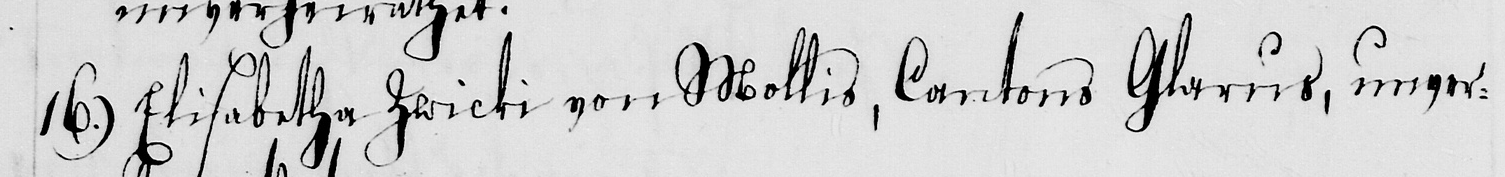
16.) Elisabetha Zwicki von Mollis, Cantons Glarus, unver¬
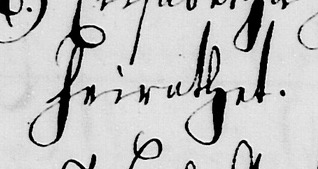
heirathet.
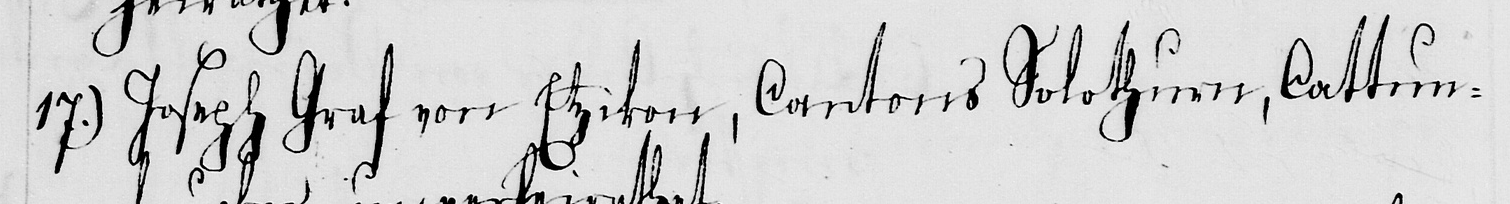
17.) Joseph Graf von Etzikon, Cantons Solothurn, Cattun¬
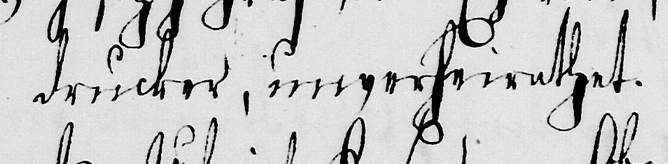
drucker, unverheirathet.
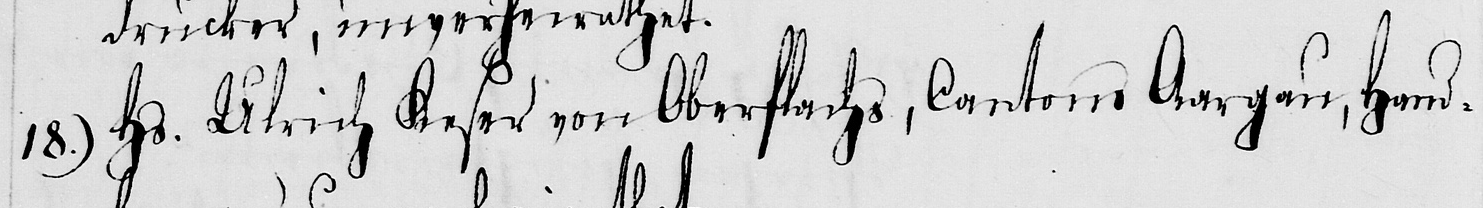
18.) Hs. Ulrich Keser von Oberflachs, Cantons Aargau, Hand¬
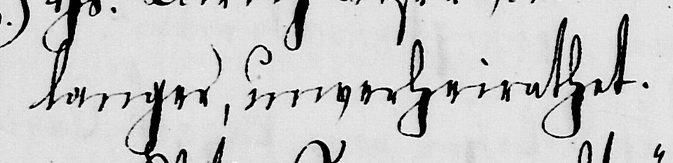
langer, unverheirathet.
